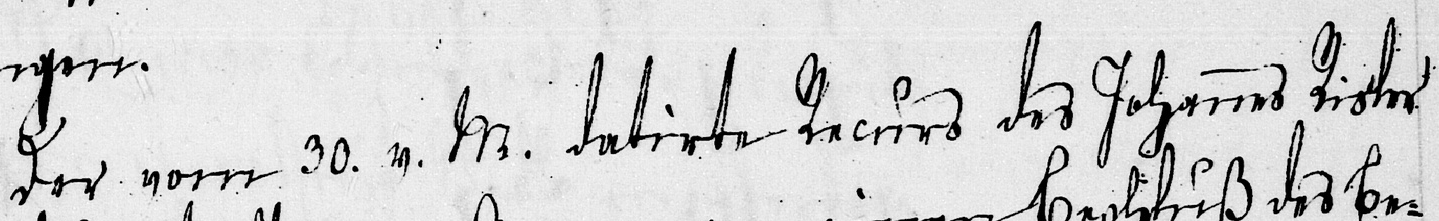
Der vom 30. v. M. datirte Recurs des Johannes Risler
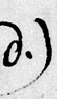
d.)
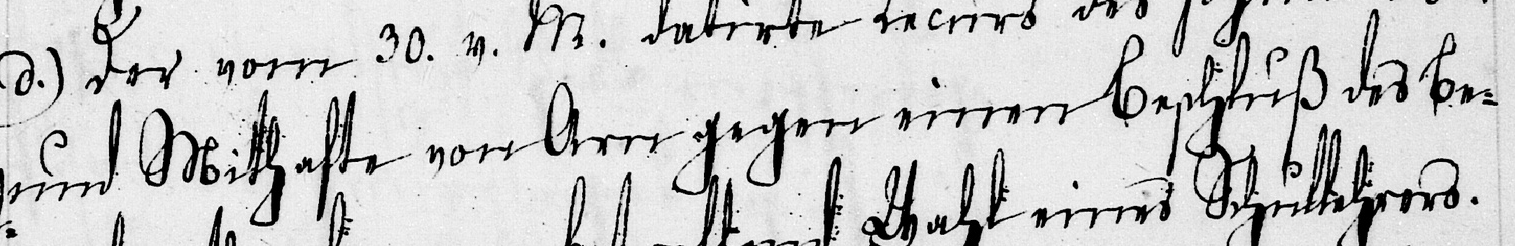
und Mithafte von Arn gegen einen Beschluß des Be¬
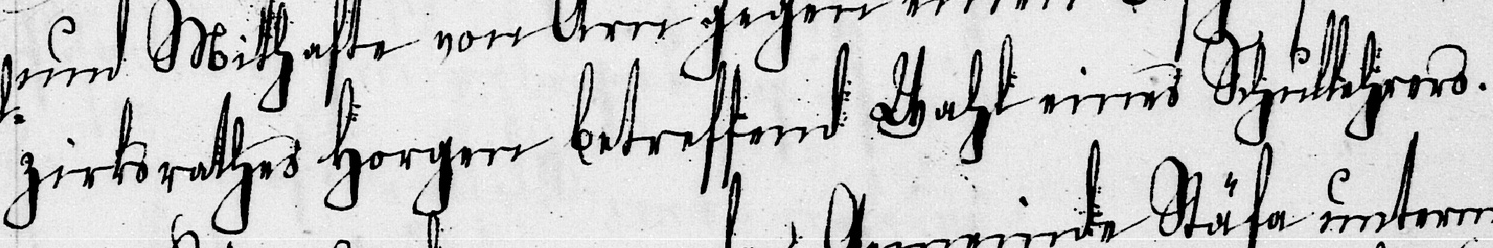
zirksrathes Horgen betreffend Wahl eines Schullehrers.
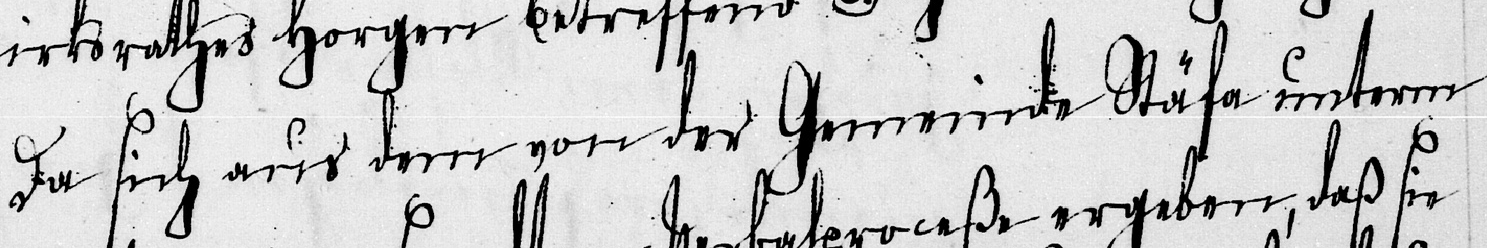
Da sich aus dem von der Gemeinde Stäfa unterm
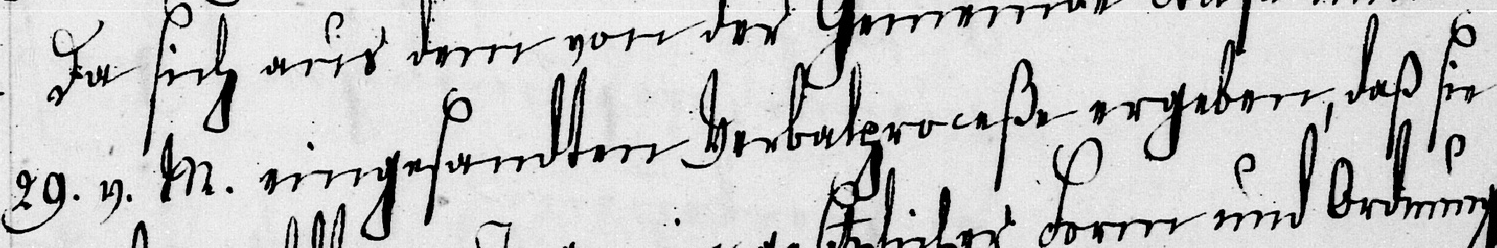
29. v. M. eingesandten Verbalproceße ergeben, daß sie
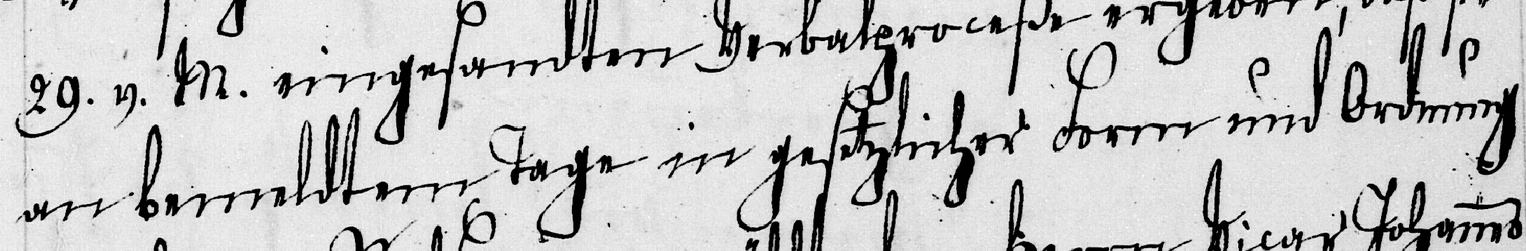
an bemeldten Tage in gesetzlicher Form und Ordnung
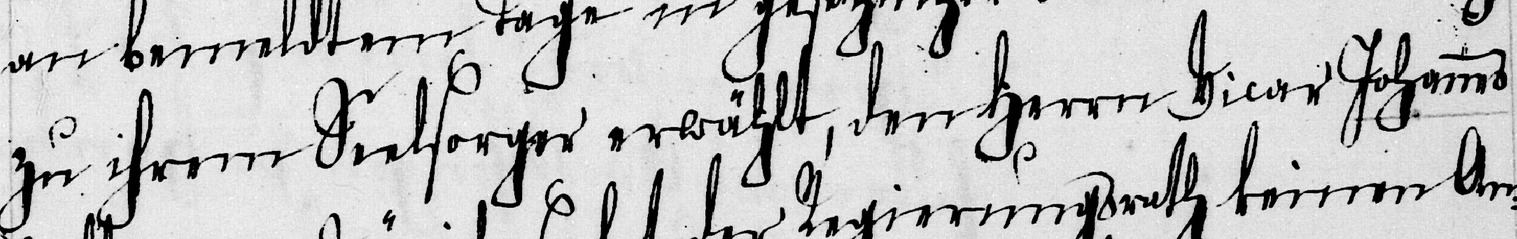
zu ihrem Seelsorger erwählt, den Herrn Vicar Johannes
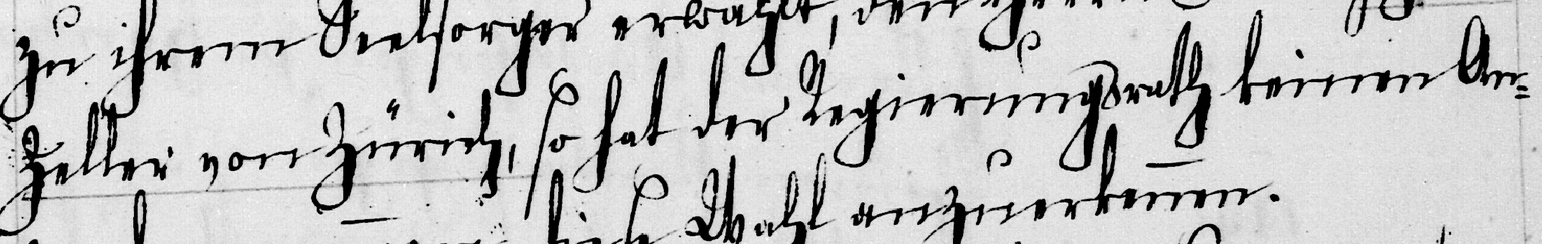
Zeller von Zürich, so hat der Regierungsrath keinen An¬
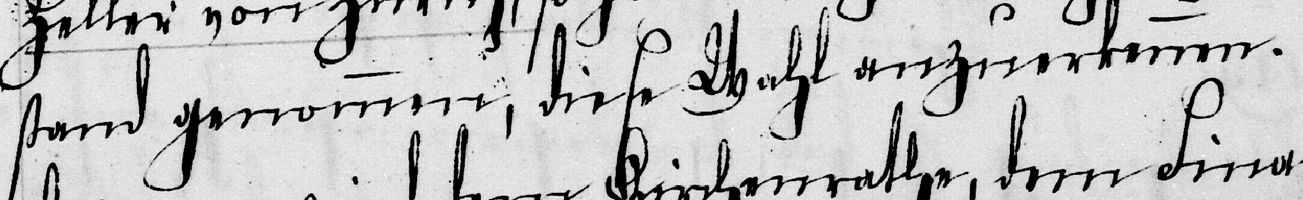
stand genommen, diese Wahl anzuerkennen.
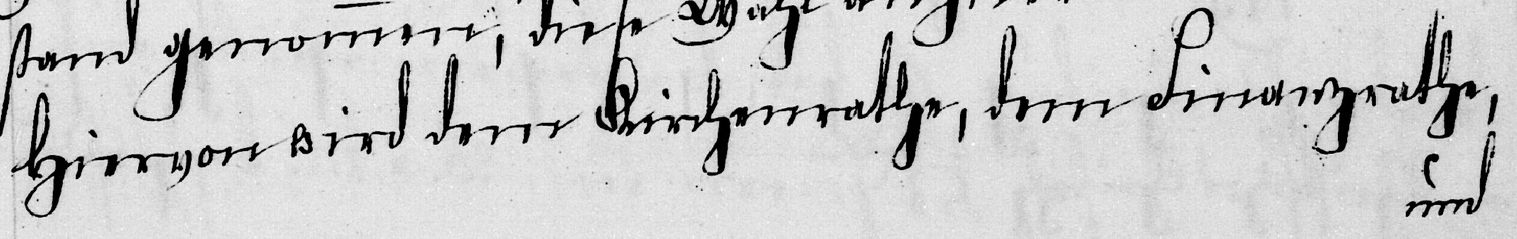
Hiervon wird dem Kirchenrathe, dem Finanzrathe,
